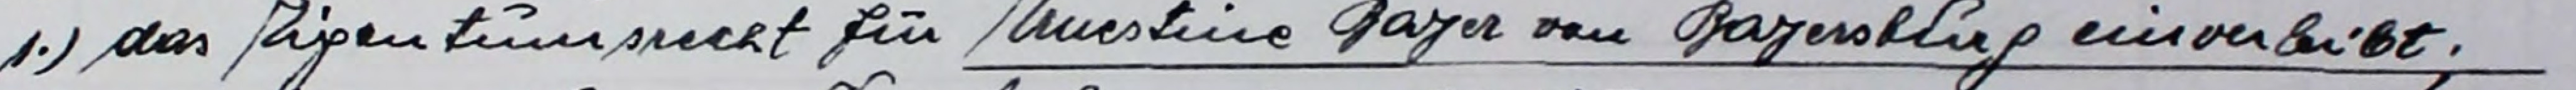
1.) das Eigentumsrecht für Ernestine Bayer von Bayersblah einverleibt;
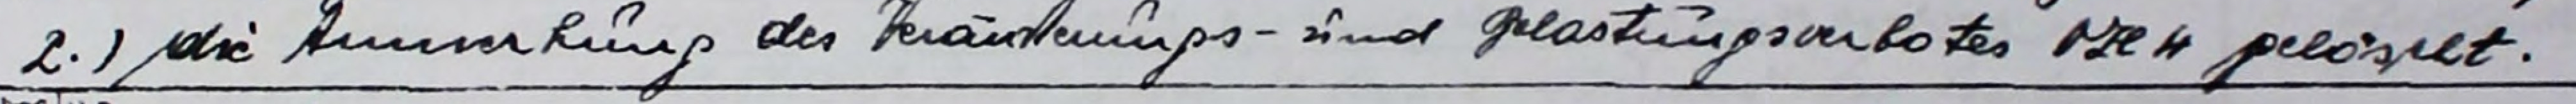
2.) die Anmerkung des Veräußerungs- und Belastungsverbotes N??? 4 gelöscht.
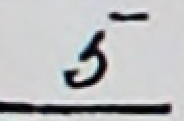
5
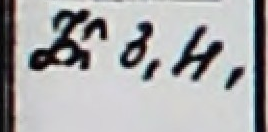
Zu 3, 4,
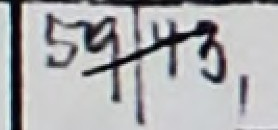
59/43,
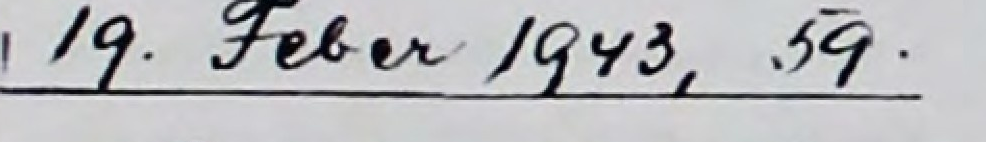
19. Feber 1943, 59.
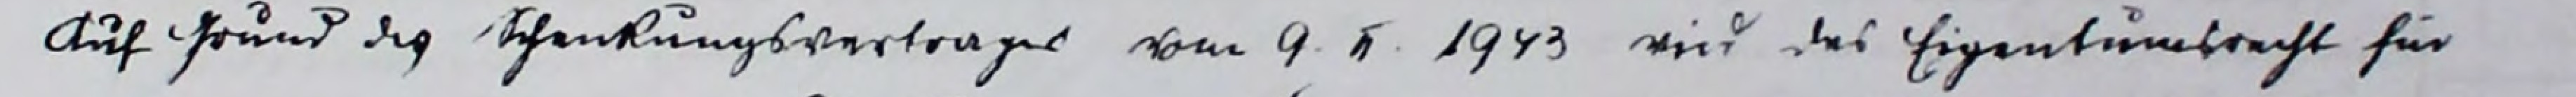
Auf Grund des Schenkungsvertrages vom 9. 5. 1943 wird das Eigentumsrecht für
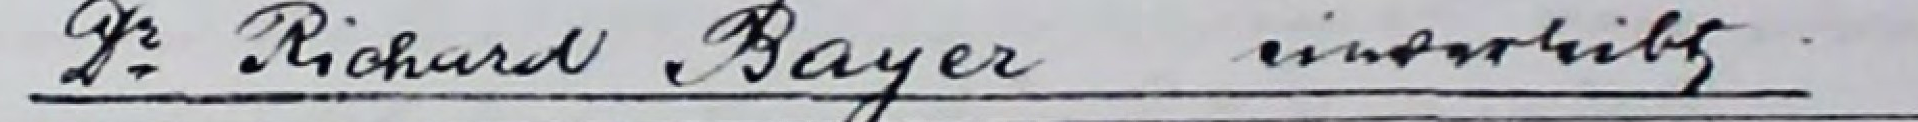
Dr Richard Bayer einverleibt.
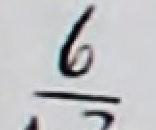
6
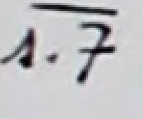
s. 7
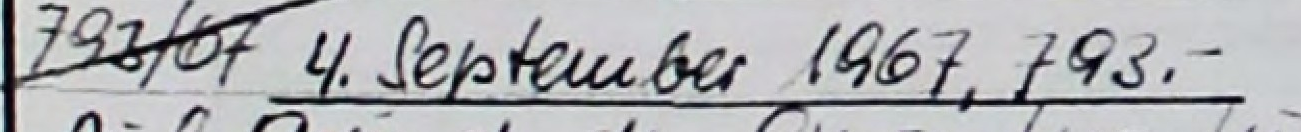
793/67 4. September 1967, 793.-
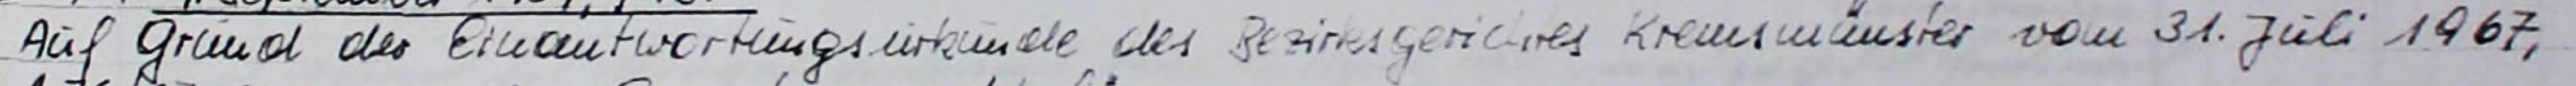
Auf Grund des Einantwortungsurkunde des Bezirksgerichtes Kremsmänster vom 31. Juli 1967,
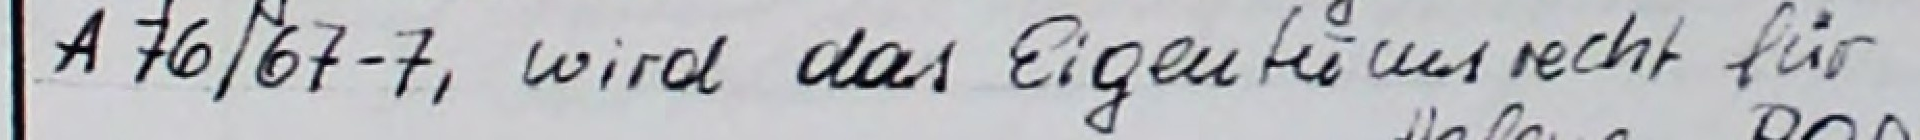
A 76/67-7, wird das Eigentumsrecht für
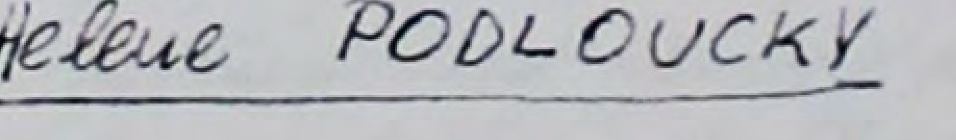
Helene PODLOUCKY
